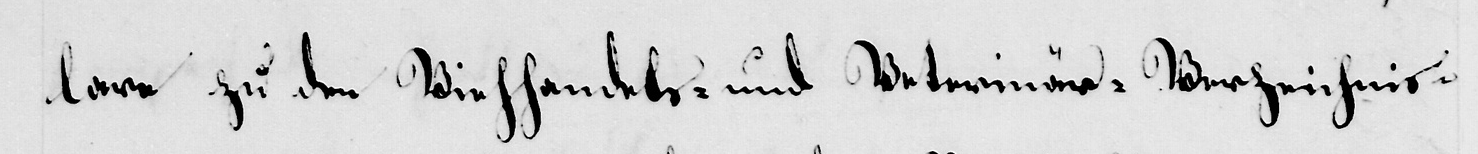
lare zu den Viehhandels- und Veterinär-Verzeichnis¬
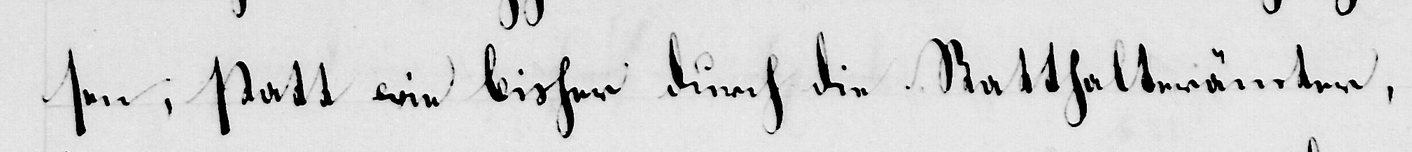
sen; statt wie bisher durch die Statthalterämter,
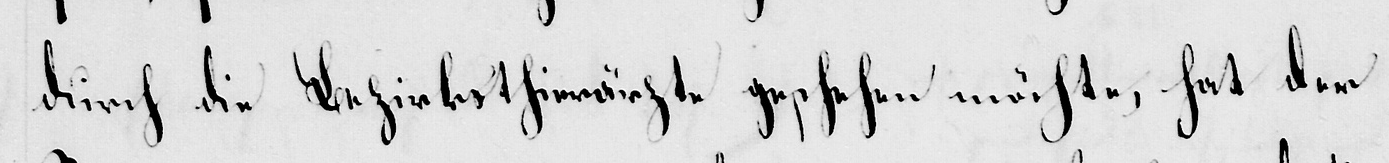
durch die Bezirksthierärzte geschehen möchte, hat der
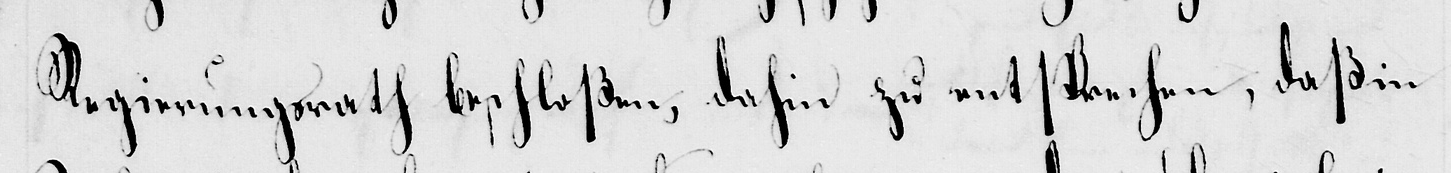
Regierungsrath beschloßen, dahin zu entsprechen, daß in
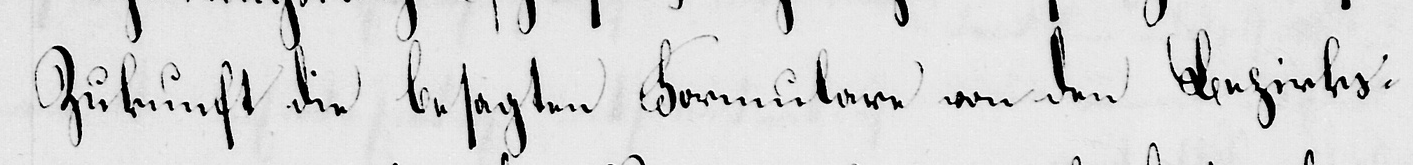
Zukunft die besagten Formulare von den Bezirks¬
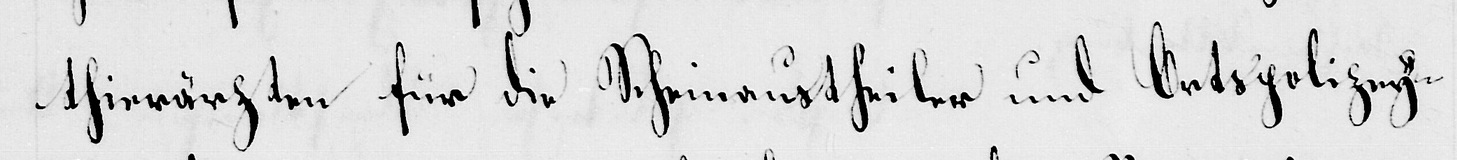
thierärzten für die Scheinaustheiler und Ortspolizey¬
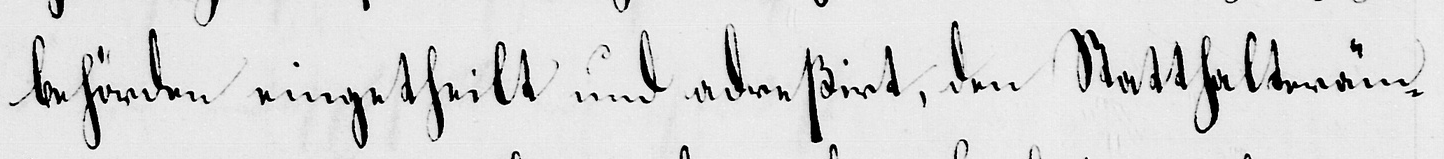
behörden eingetheilt und adreßirt, den Statthalteräm¬
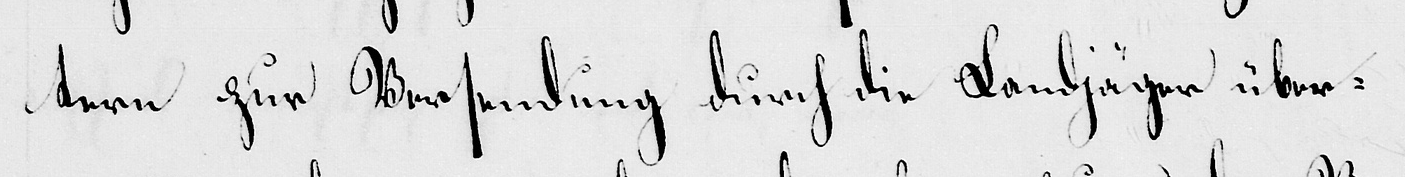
tern zur Versendung durch die Landjäger über¬
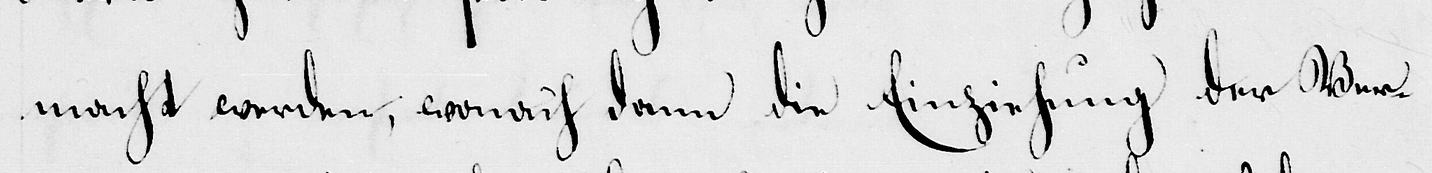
macht werden, wonach dann die Einziehung der Ver¬
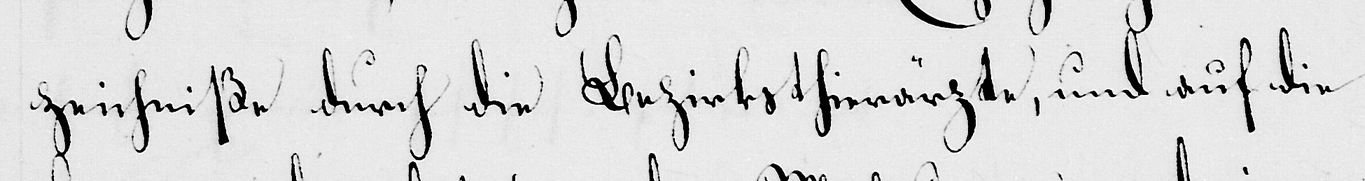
zeichniße durch die Bezirksthierärzte, und auf die
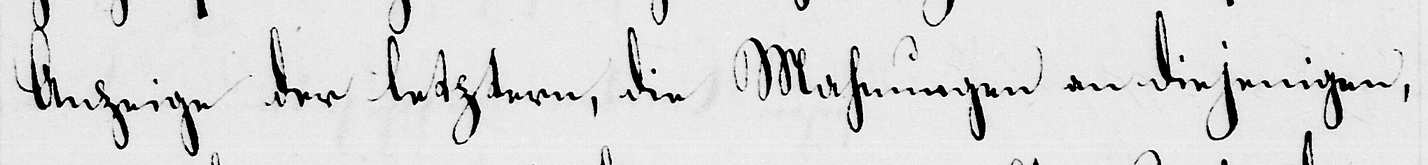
Anzeige der letztern, die Mahnungen an diejenigen,
